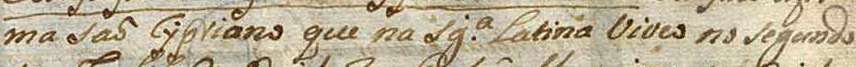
ma saõ Cypriano que na Ig.ra Latina viveo no segundo
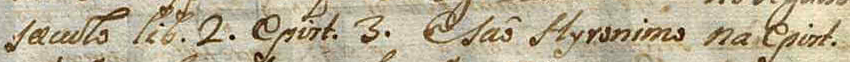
sæculo lib. 2. epist. 3. E saõ Hyronimo na Epist.
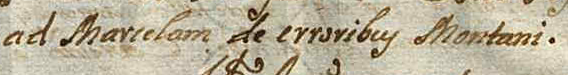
ad Marcelam de erroribus Montani.
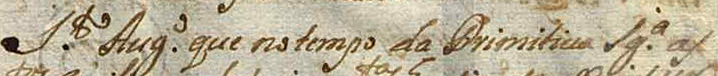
S.to Aug.o que no tempo da Primitiua Ig.a as
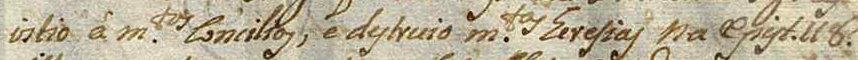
istio á m.tos Concilios, e destruio m.tas heresias na epist. 118.
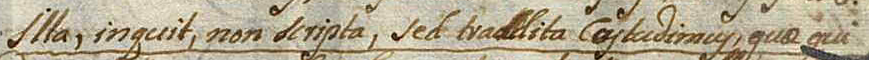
Illa, inquit, non scripta, sed traddita Custudimus, quæ qui
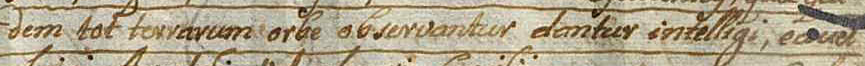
dem tot terrarum orbe observantur dantur intelligi, ea uel
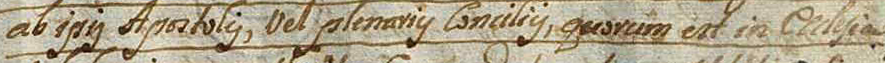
ab ipsis Apostolis, vel plenaries Concilies, quorum est in Ecclesia
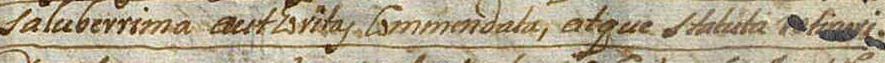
saluberrima authoritas Commendata, atque statuta retineri.
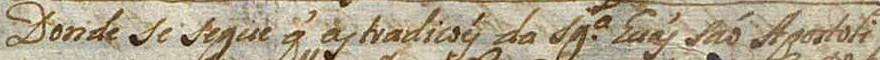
Donde se segue q̄ as tradicoẽs da Ig.a huās saõ Apostoli
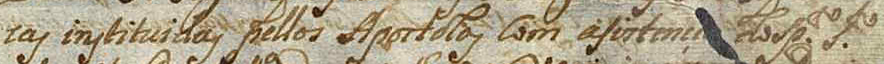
cas instituidas pellos Apostolos com asistença do sp.to S.to
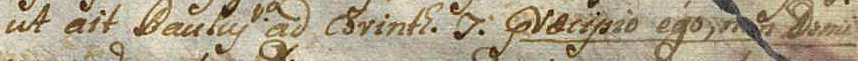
ut ait Paulus ad Corinth. 7. præcipio ego, __ Domi
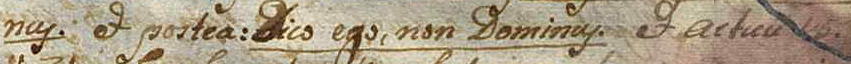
nus. et postea: Dico ego, non Dominus. et act__5
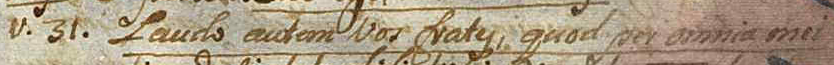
V. 31. Laudo autem vos frates, quod per omnia mei
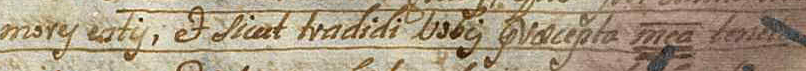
mores estis, et sicut tradidi vobis procepta mea tene
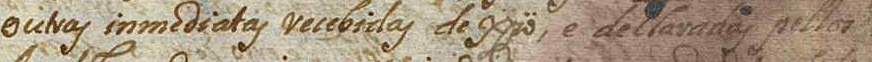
outras inmediatas recebidas de xpō, e declaradas pellos
